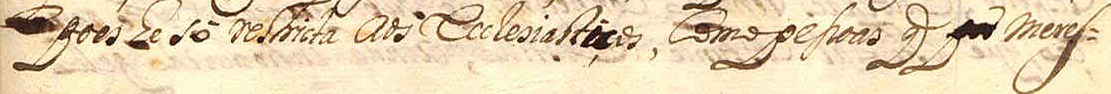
poes he só restricta aos Ecclesiasticos, Como pessoas q̄ por meres
